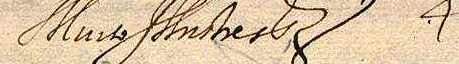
Muito Jllustres s̄es
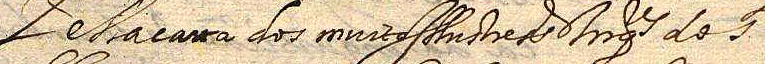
Pella carta dos muito Jllustres sres Inqres do sto
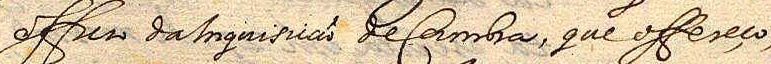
officio da Inquisicaõ de Coimbra, que offereço,
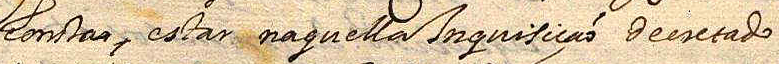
consta, estar naquella Inquisiçaõ decretado
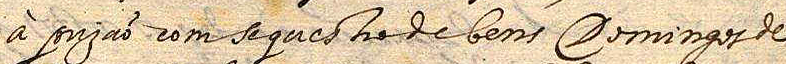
à prizaõ com sequestro de bens Domingos de
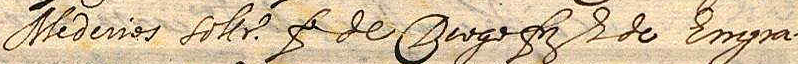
Medeiros soltro. fo de Diogo frz E de Engra
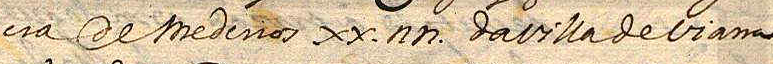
cia de medeiros xx.nn da villa de viana
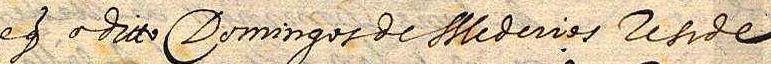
e q̄ o ditto Domingos de Medeiros Reside
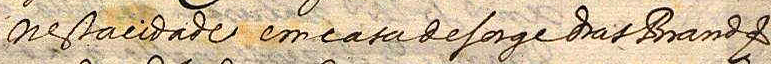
nesta cidade em casa de Jorge dias Brandaõ
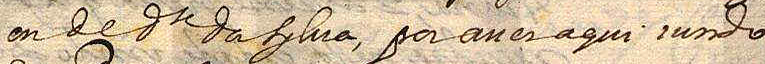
ou de dte da sylua, por auer aqui uindo
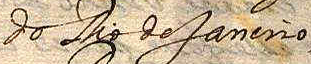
do Rio de Janeiro,
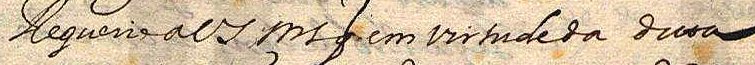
Requerio a Vs Ms q̄ em virtude da ditta
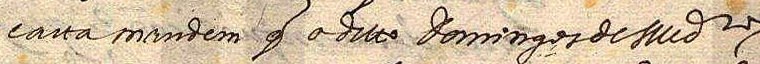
carta mandem q̄ o ditto Domingos de Medros
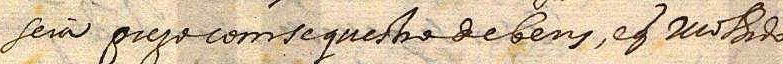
seia prezo com sequestro de bens, e q̄ recolhido
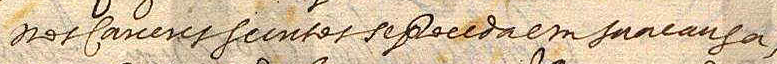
nos Carceres juntos se proceda em sua causa,
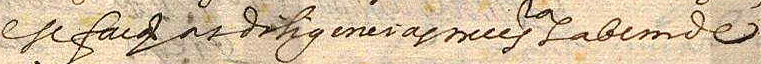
e se facaõ as diligencias necesras a bem de
